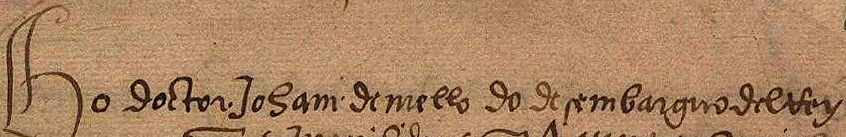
Ho doctor Joham de mello do desembarguo del Rey
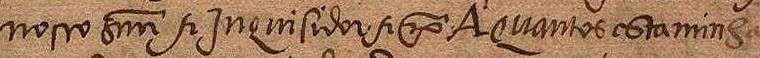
nosso sn̄or e Jnquisidor e c̄ꝭ A quantos esta minha
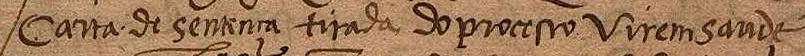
Carta de sentença tirada do processo Virem saude
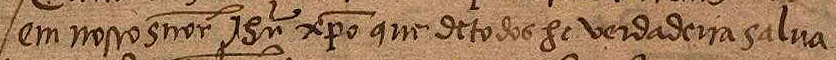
em nosso s̄nor Jhū xp̄o que de todos he verdadeira salua
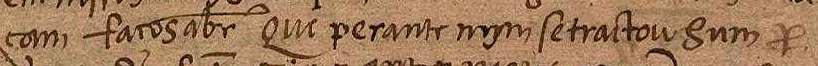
çam faço sabr̄ que perante mym se tractou hum ꝓ
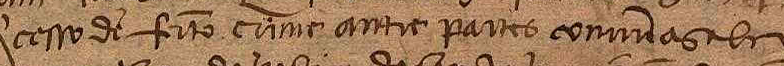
cesso de feito crime antre partes comuē a saber
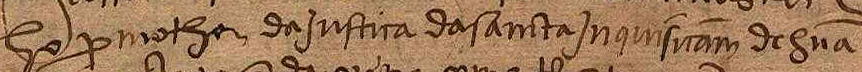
ho ꝓmothor da Justiça da sancta Jnquisiçam de huā
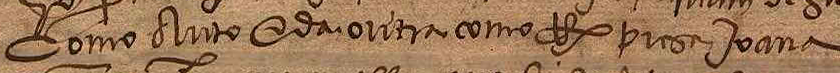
Como Auto e da outra como Rꝭ presa Joana
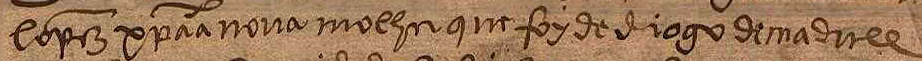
lopez xpāa noua molher que foy de diogo de madrill
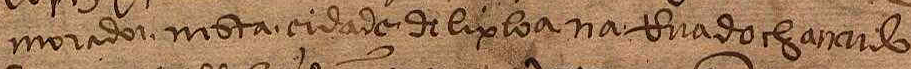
morador nesta cidade de lixboa na Rua do chancudo
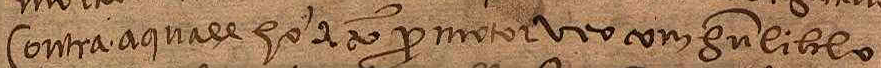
Contra a quall ho dito ꝓmotor veo com hū libelo
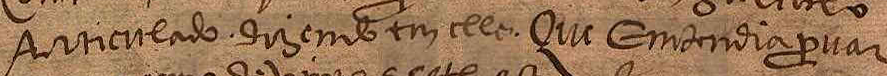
Articulado dizendo em elle. Que Emtendia ꝓuar
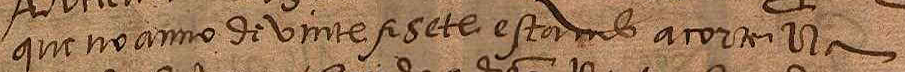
que no anno de vinte e sete estando a corte Na
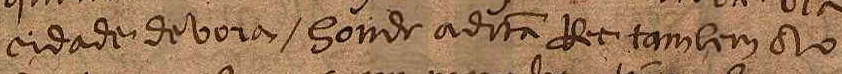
cidade devora / honde a dita Ree tambem Ao
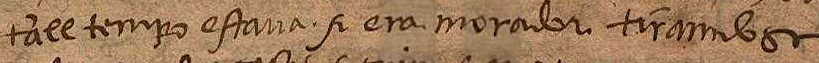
tall tempo estaua. e era morador tiramdose
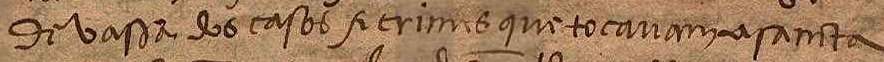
devassa dos casos e crimes que tocauam a sancta
